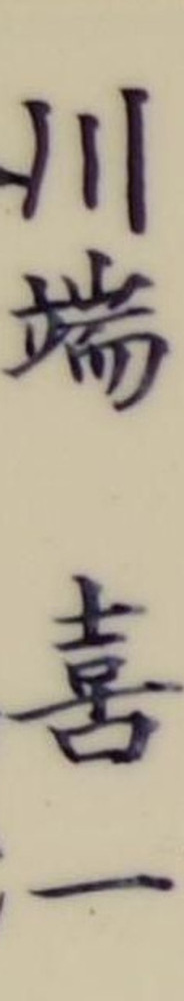川端喜一

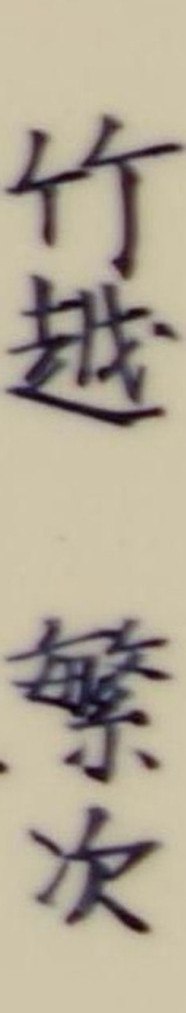竹越繁次
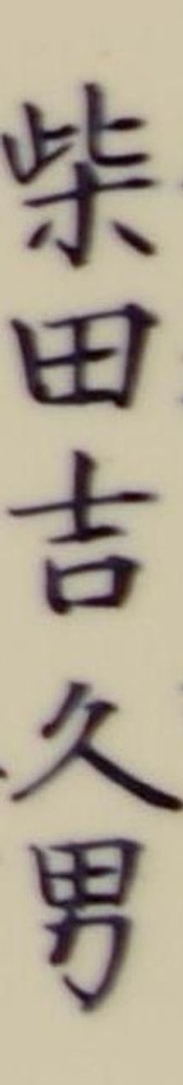柴田吉久男
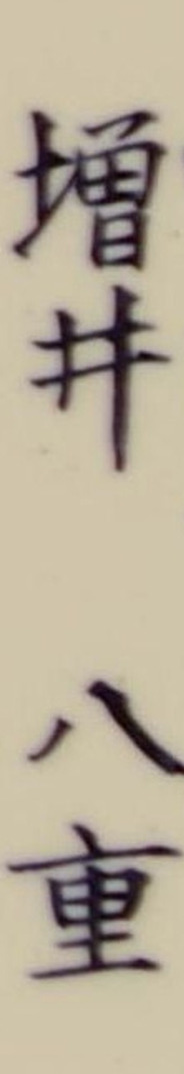増井八重
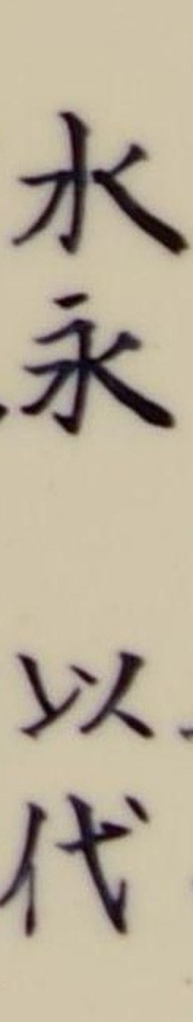水永以代
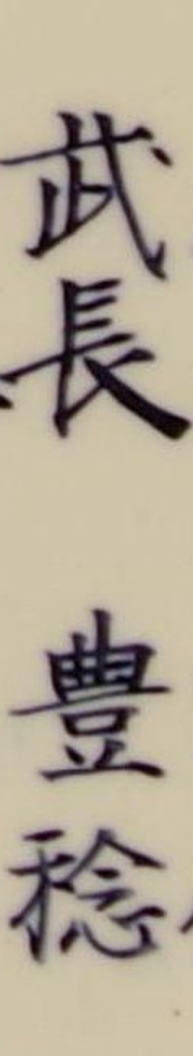武長豊稔
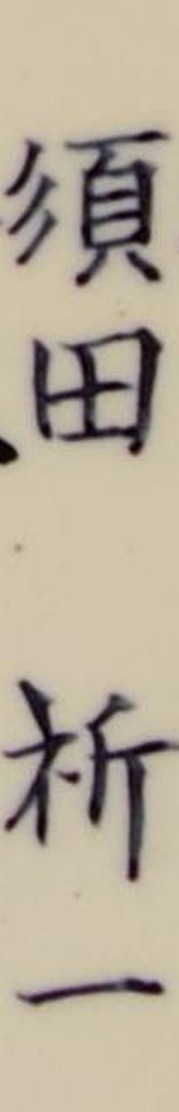須田祈一
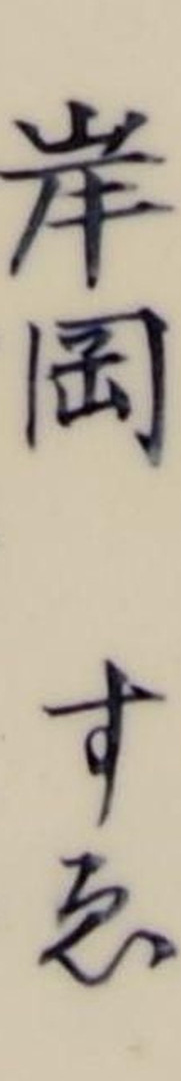岸岡すゑ
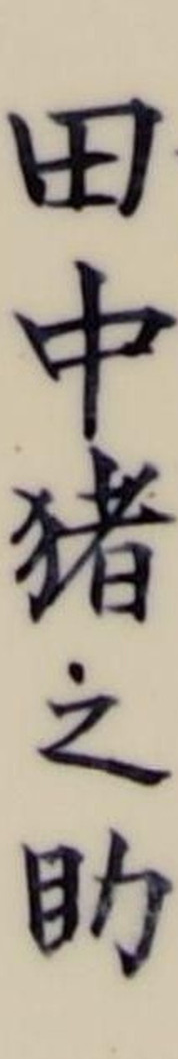田中猪之助
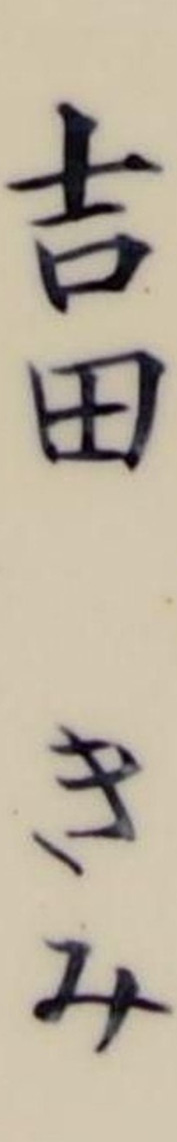吉田きみ
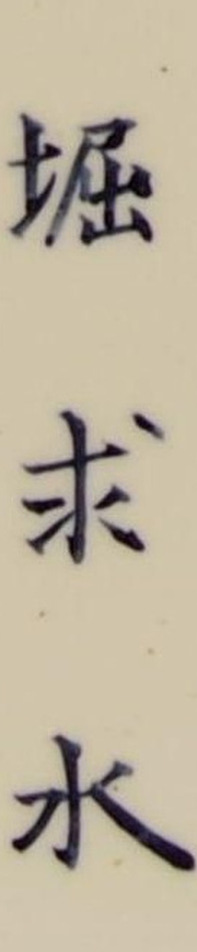堀求水
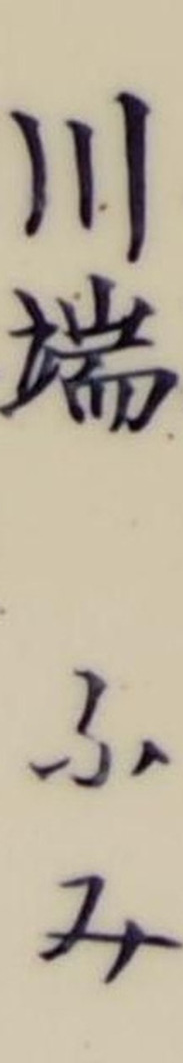川端ふみ
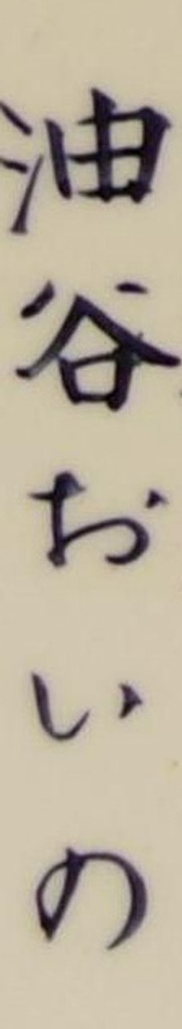油谷おいの
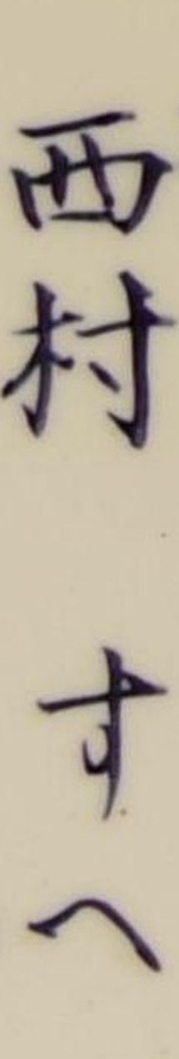西村すへ
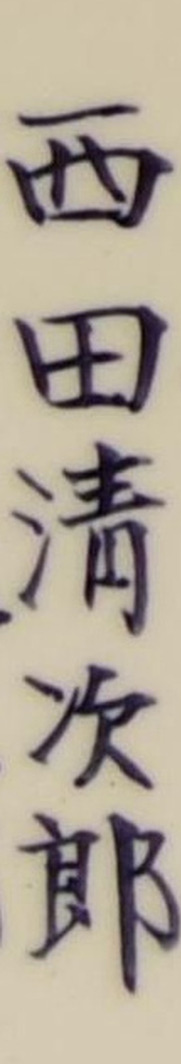西田清次郎
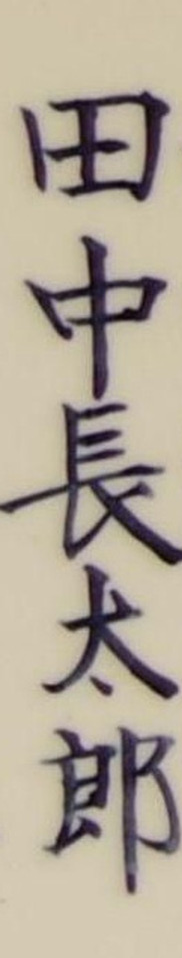田中長太郎
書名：A~D
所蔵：koyasan kongobuji
